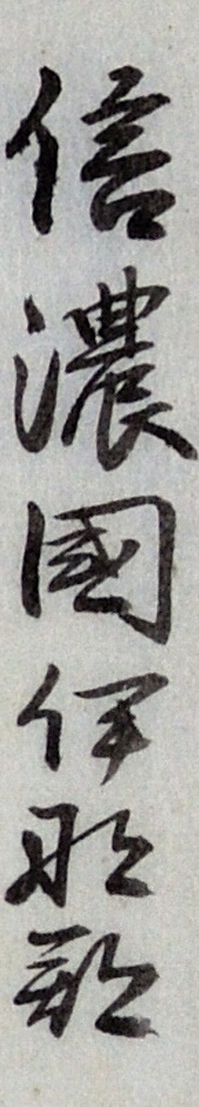信濃国伊那郡
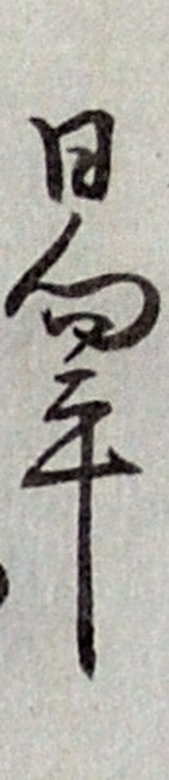日向平
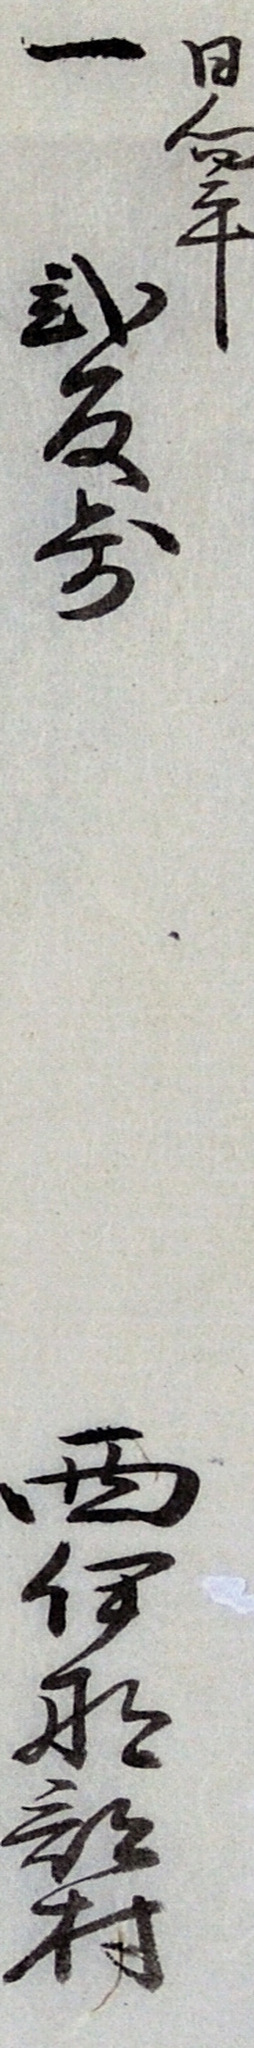一弐反歩西伊那部村
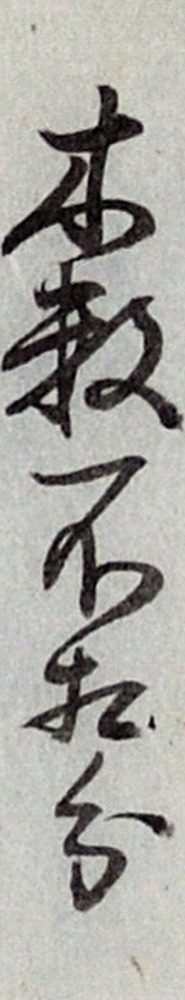木数不相分
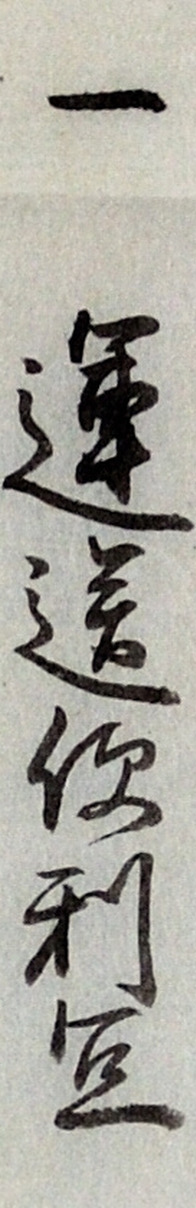一運送便利宜
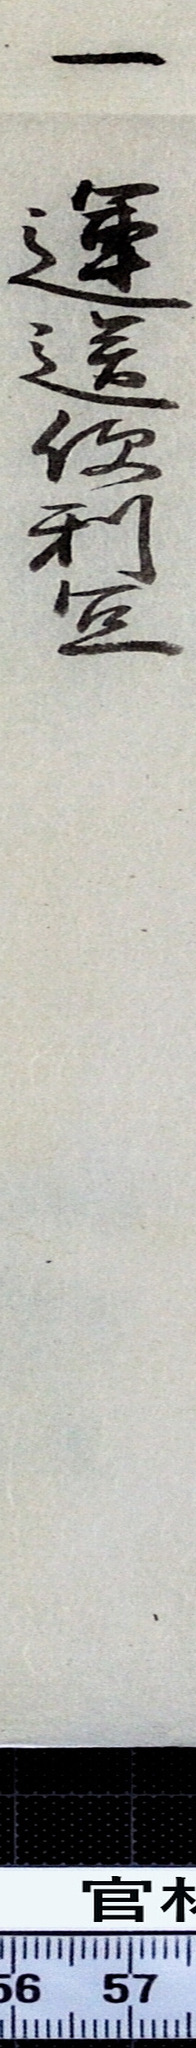一運送便利宜
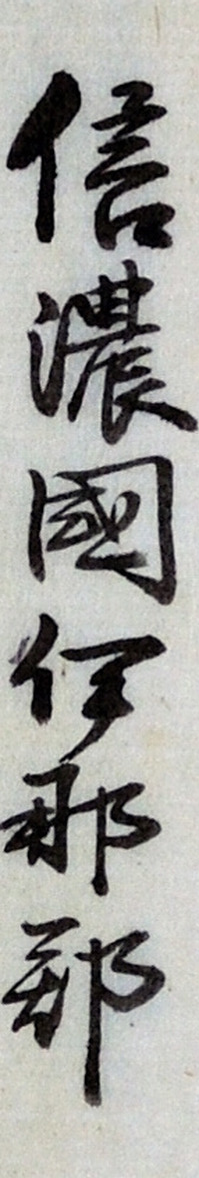信濃国伊那郡
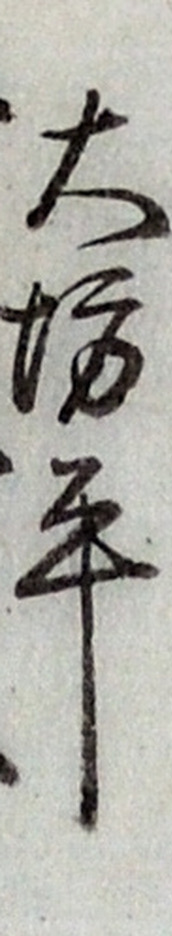大坊平
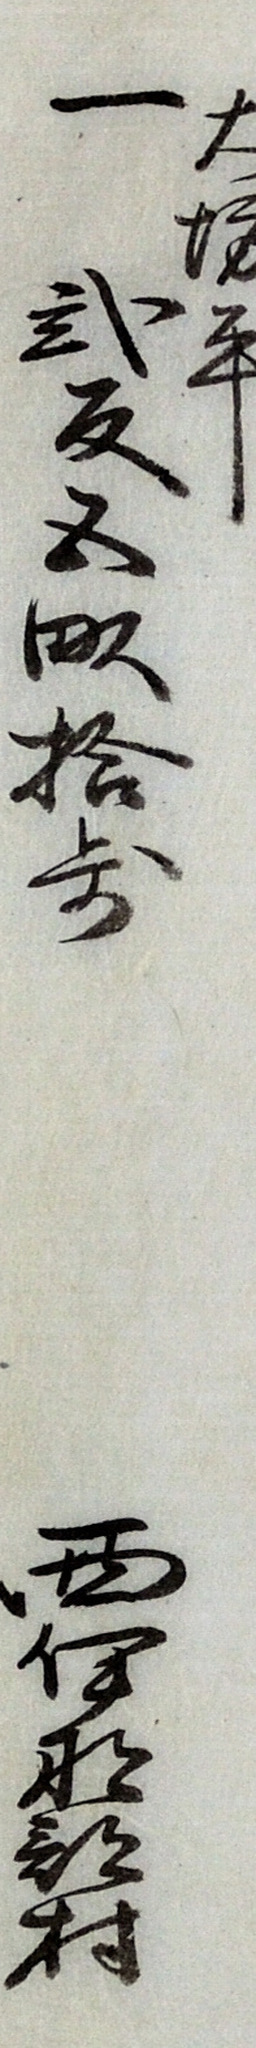一弐反五㽗拾歩西伊那部村
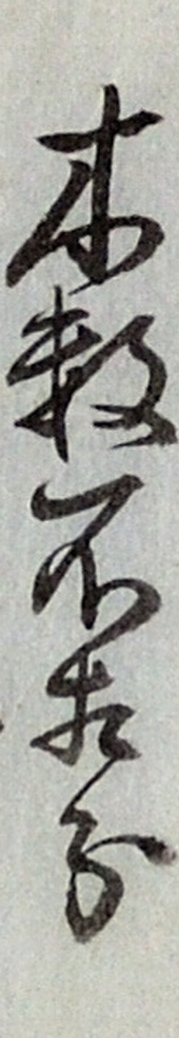木数不相分
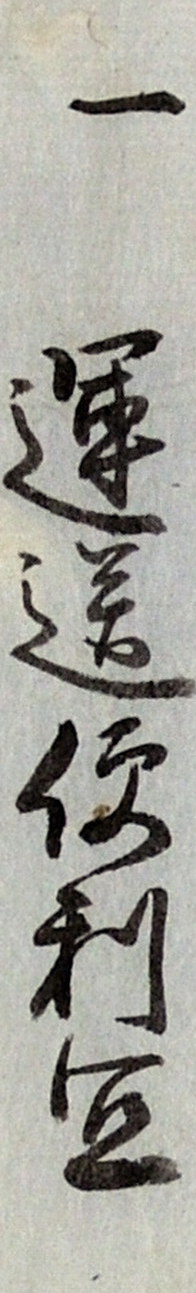一運送便利宜

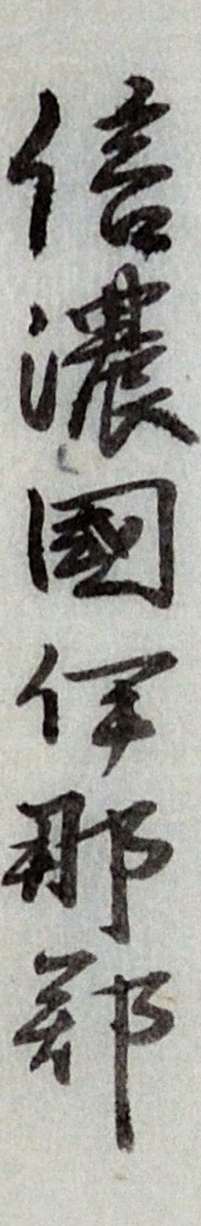信濃国伊那郡
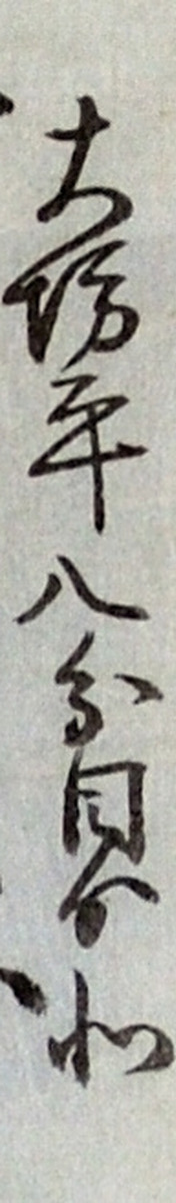大坊平八分目ゟ北
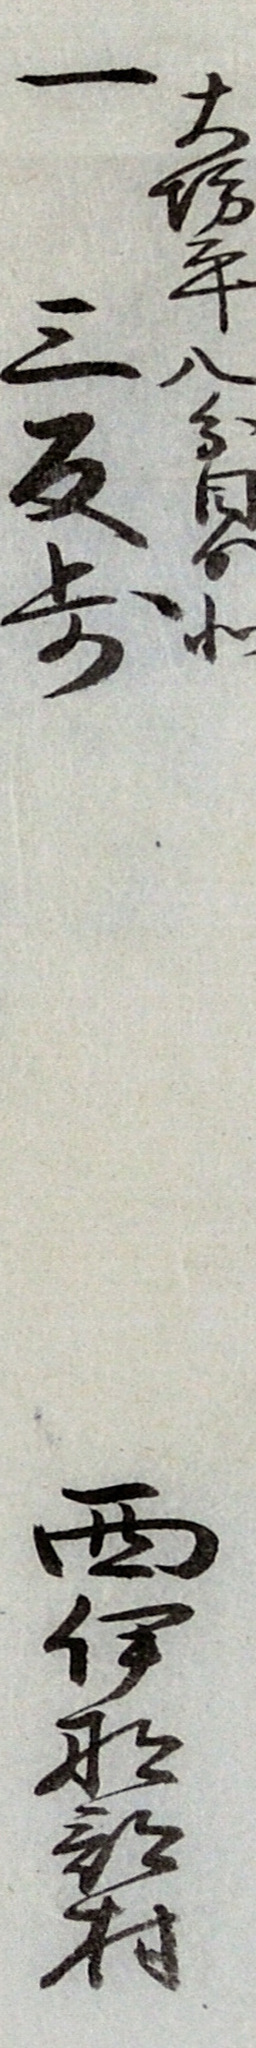一三反歩西伊那部村
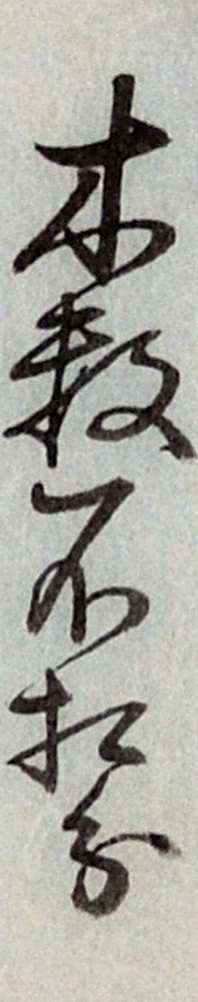木数不相分
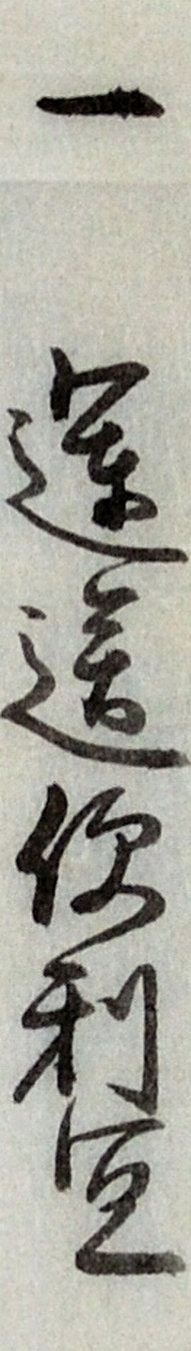一運送便利宜
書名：官林反別帳
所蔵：伊那市立高遠町図書館・合同会社AMANE
